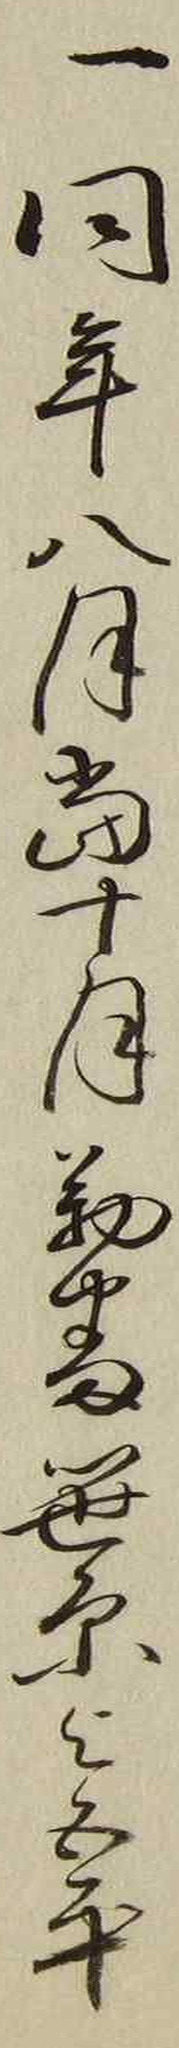一同年八月当十月勤番笹原与五平
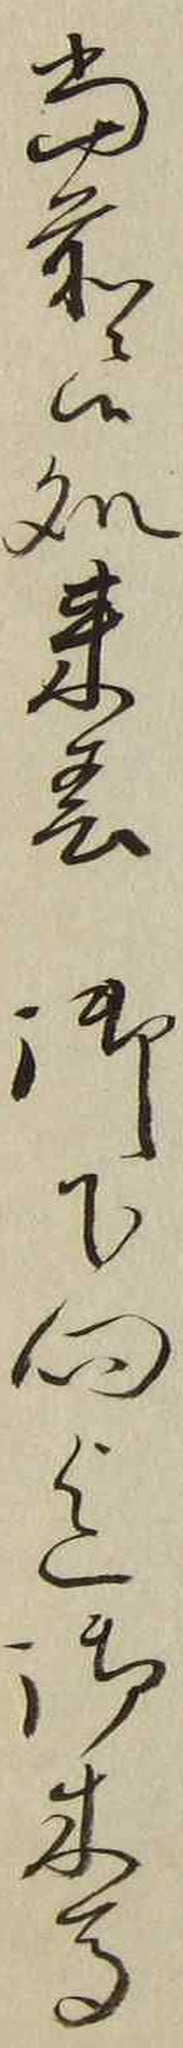当前ニ候処来春御下向迄御木馬

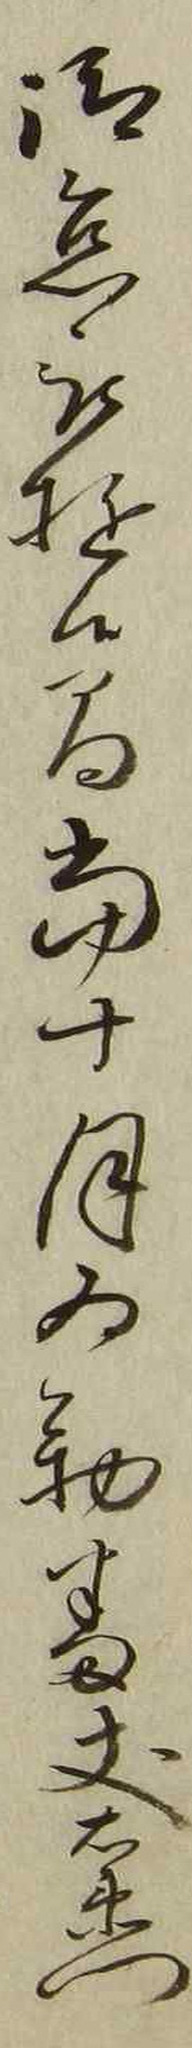御怠被遊候間当十月為勤番丈右衛門
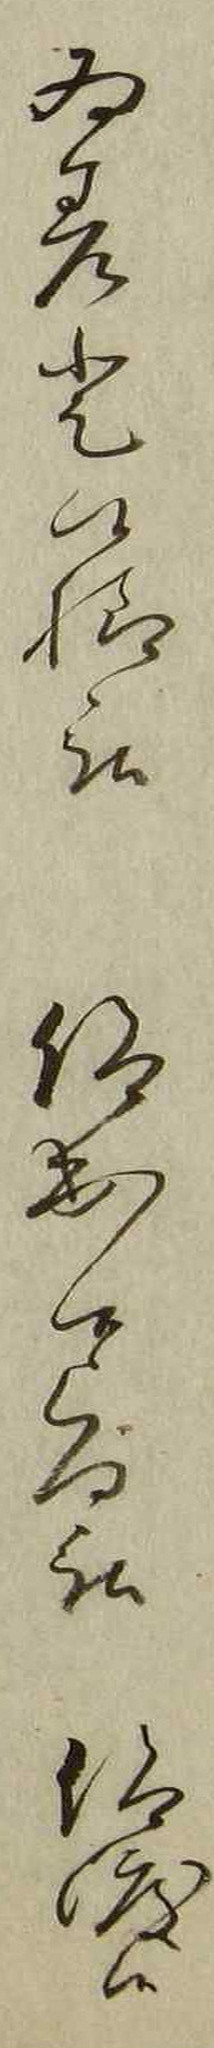為差登候様被仰出候旨被仰渡候
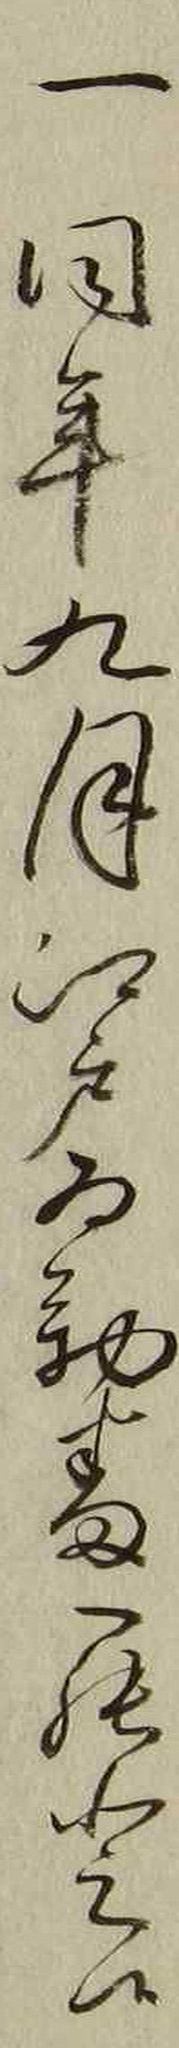一同年九月江戸為勤番罷登候
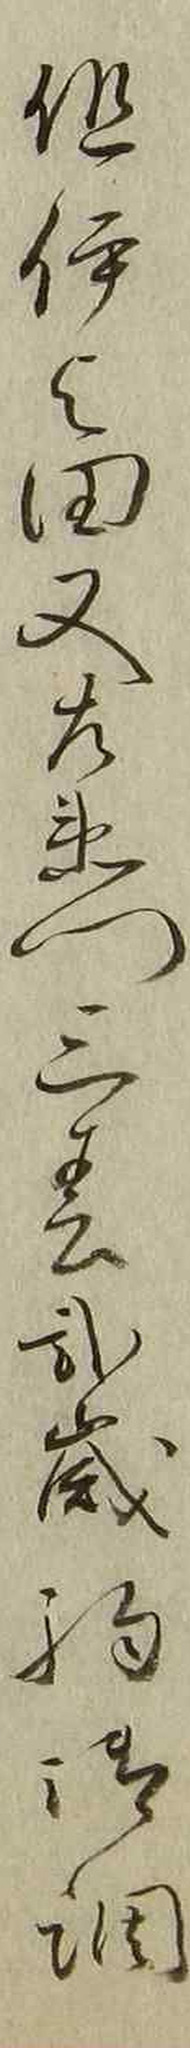但伊与田又左衛門三春二歳駒御調
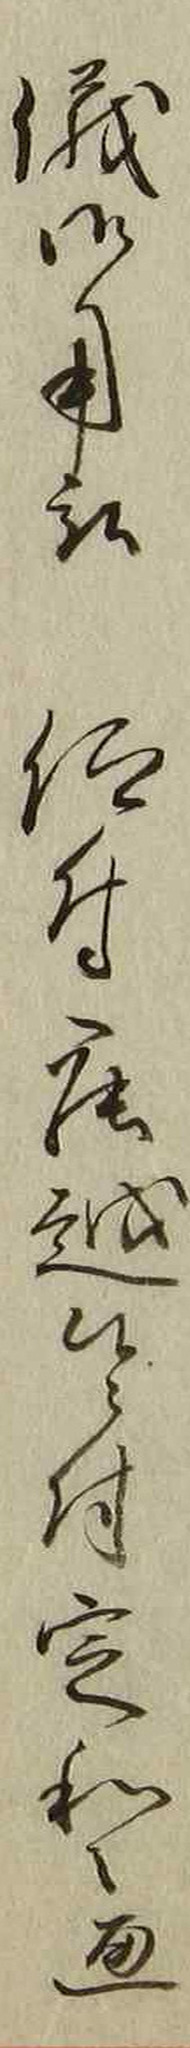儀御用被仰付罷越候ニ付定和之通
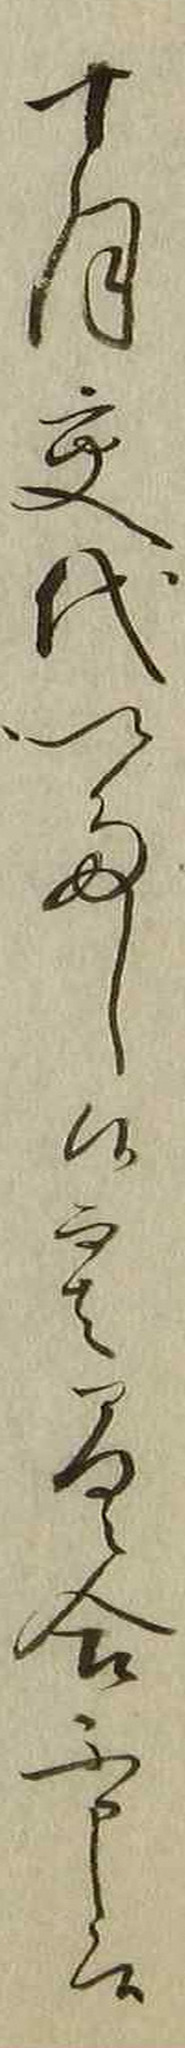十月交代いたし候而者間ニ合不申候
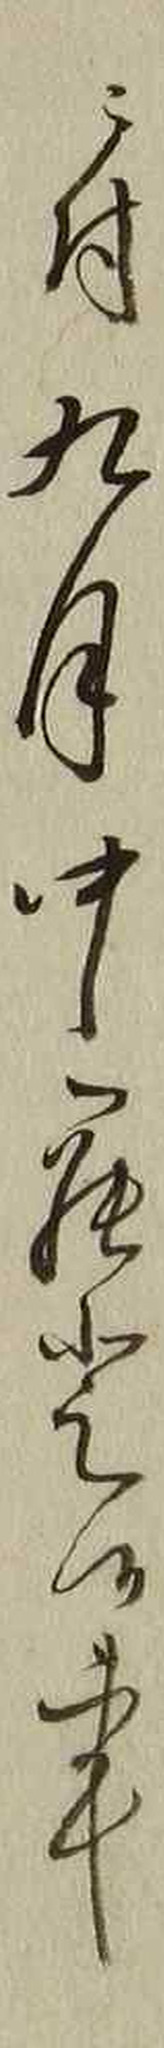ニ付九月中罷登候事
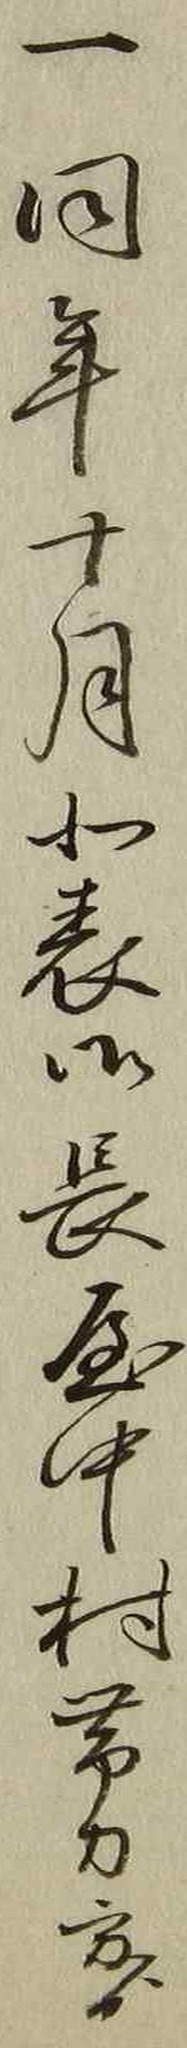一同年十月北表御長屋中村帯刀方ゟ
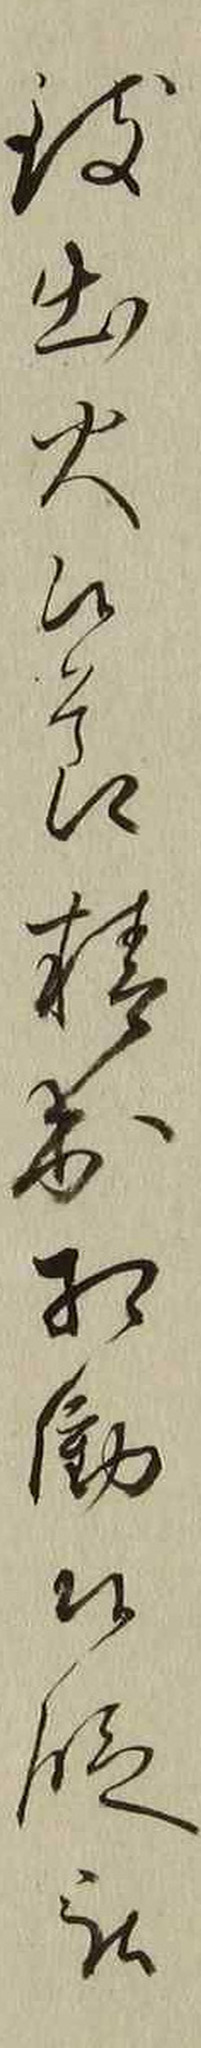致出火候節精出相働候段被
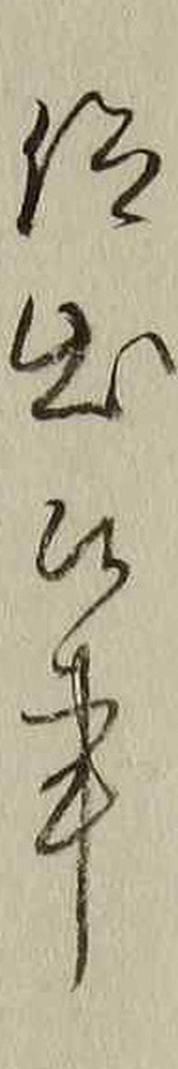仰出候事
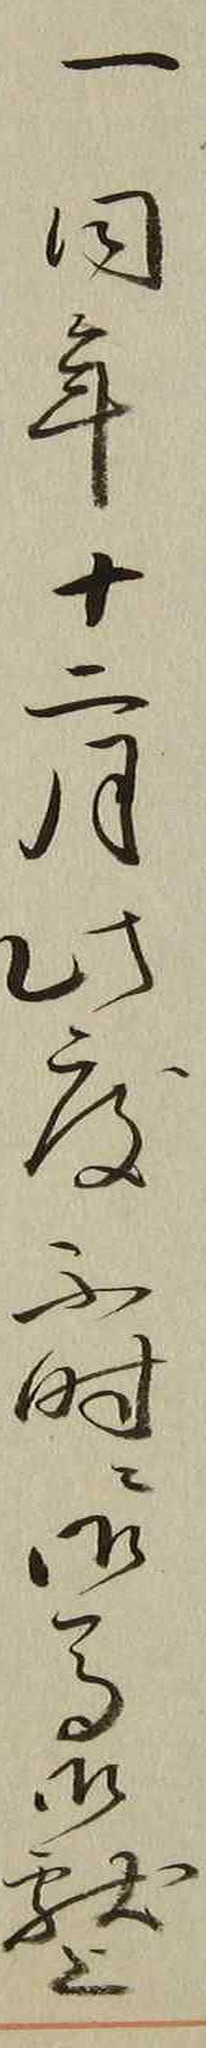一同年十二月此度不時ニ御馬御献上
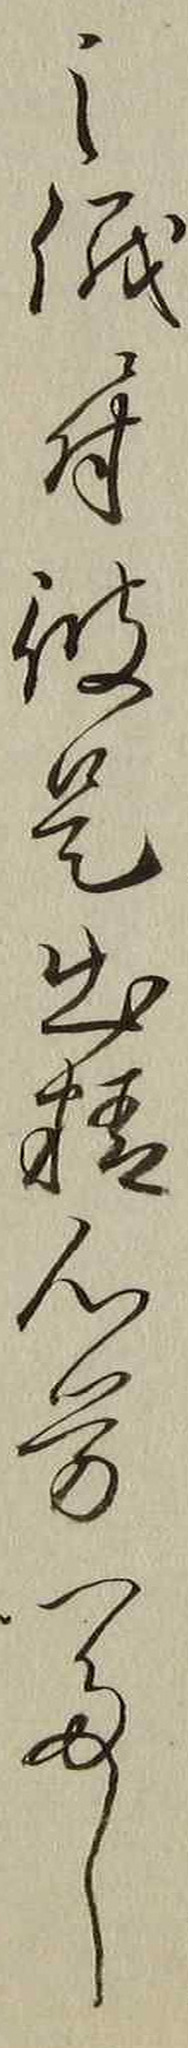之儀ニ付彼是出精心労いたし
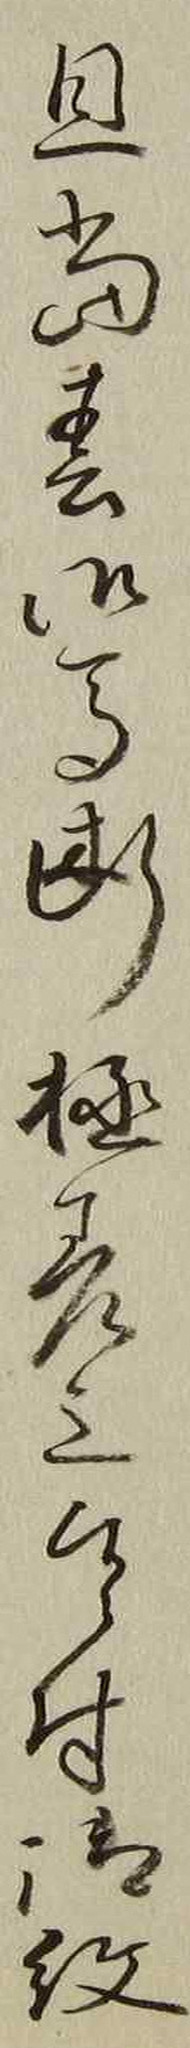且当春御馬術極差上候ニ付御紋
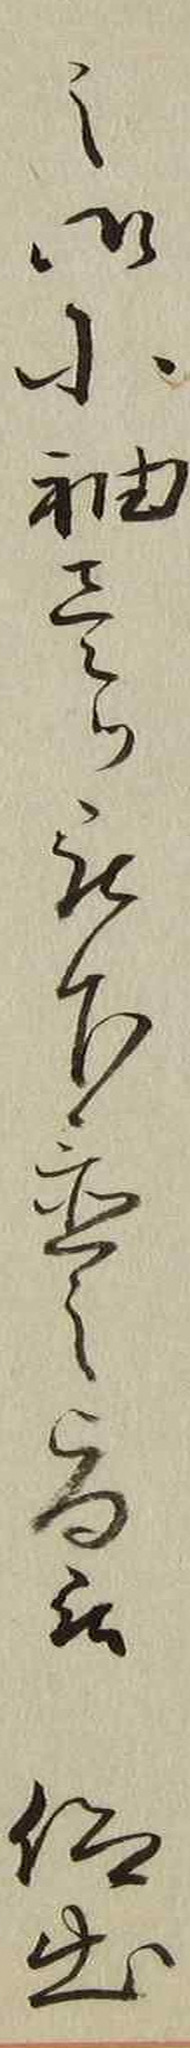之御小袖壱ツ被下置之旨被仰出
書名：諸士系譜　巻之3　い之部3
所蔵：会津若松市立会津図書館
